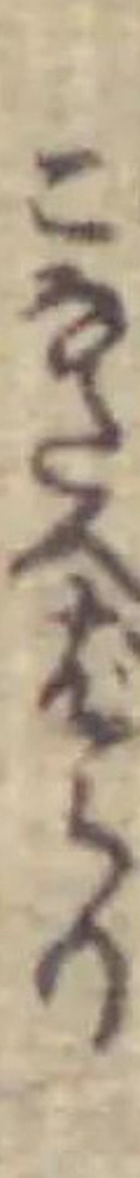こなたへばらり
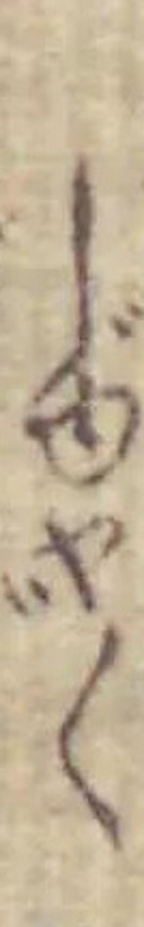じゆや〳〵
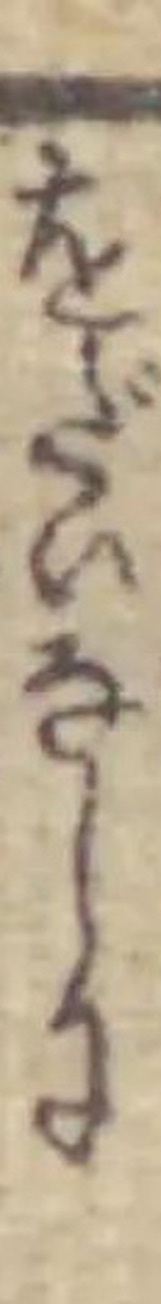をだいなしに
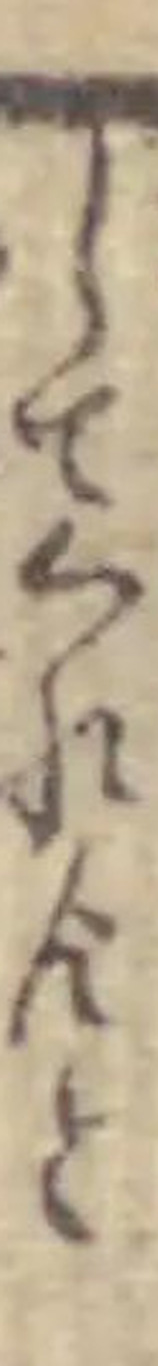してくれんと
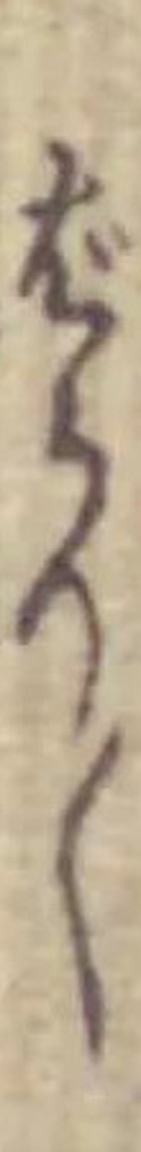ばらり〳〵
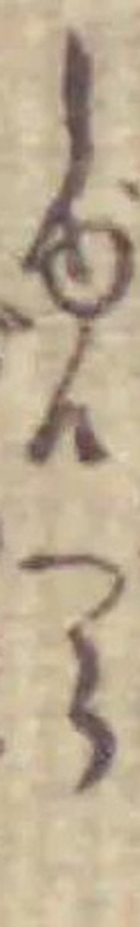じゆんづら
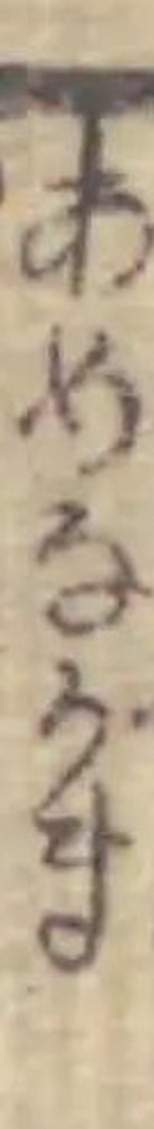あめなかま
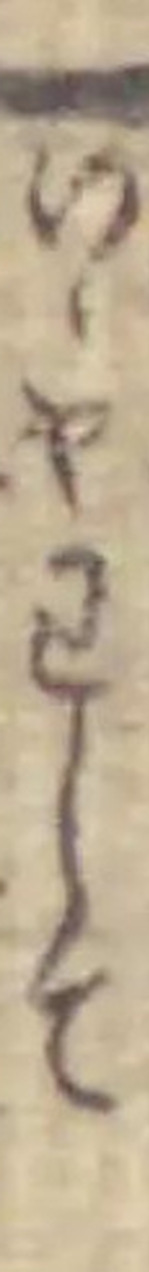いゝやわして
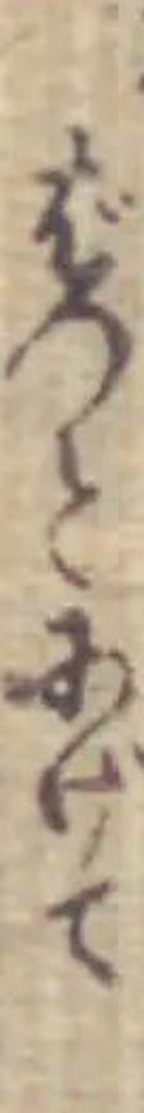ばつとにげて
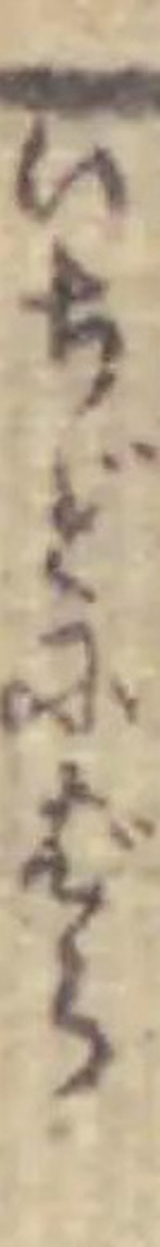いちどにばら
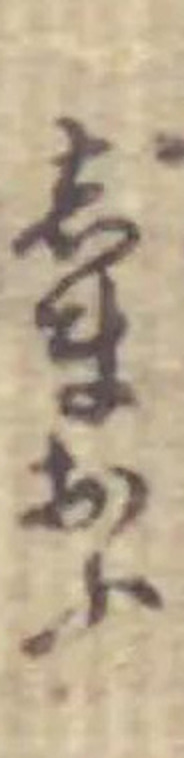しまおふ
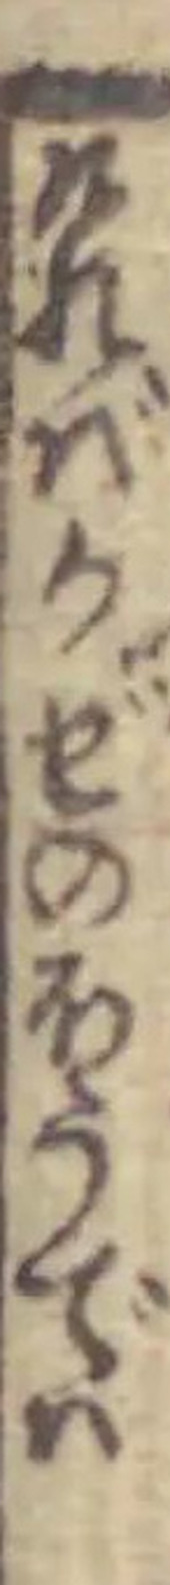ければかぜのほうでは
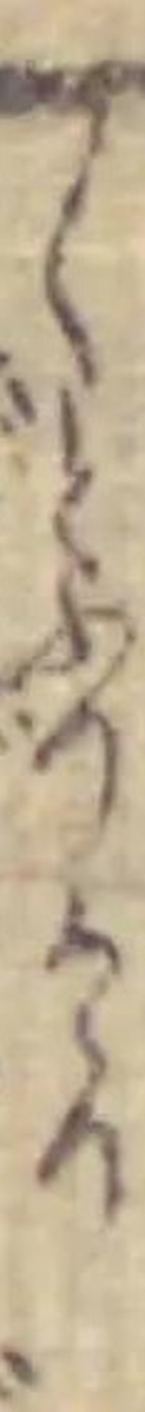〳〵とふりかゝり
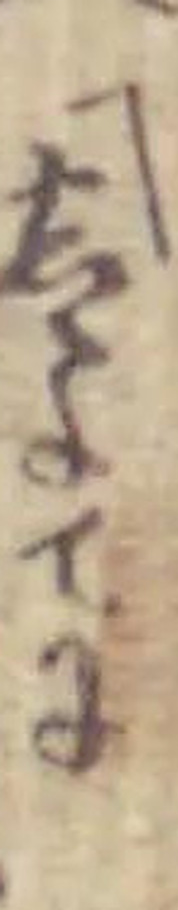〽しよてに
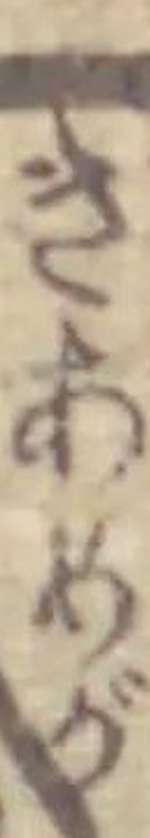きあめが
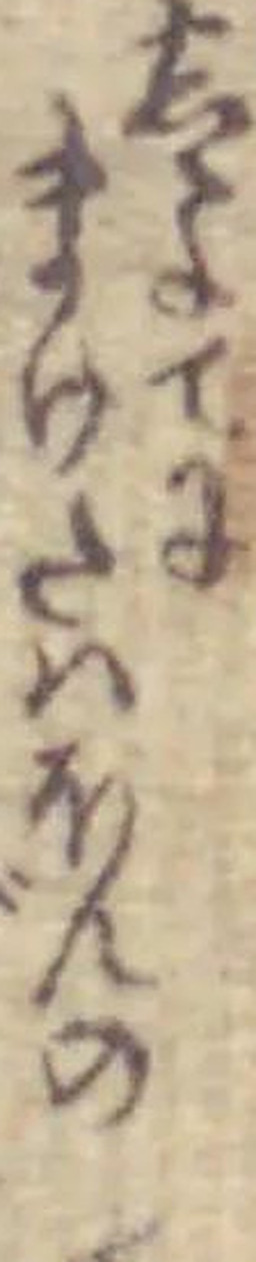まけたはほんの
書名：雨宮風宮出儘略縁記 3巻
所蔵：国立国会図書館 National Diet Library, JAPAN
